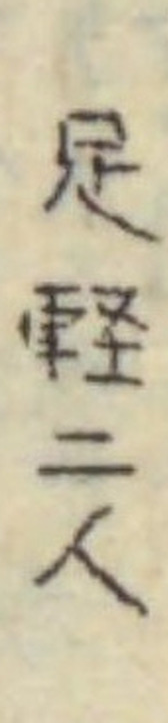足軽二人
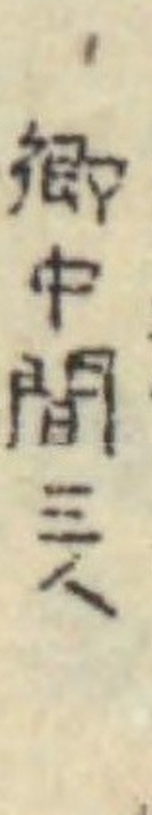御中間三人
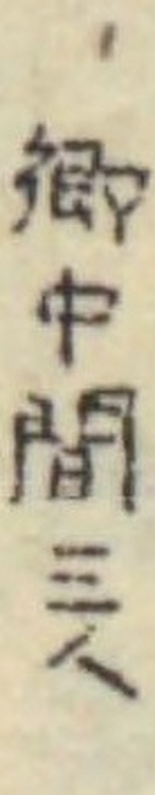御中間三人
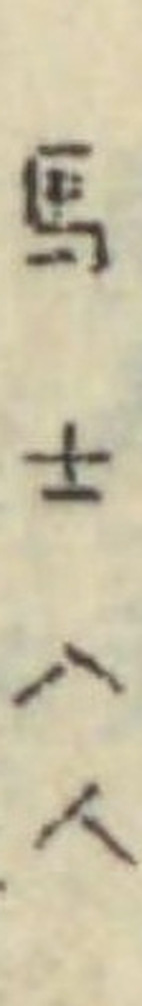馬士八人
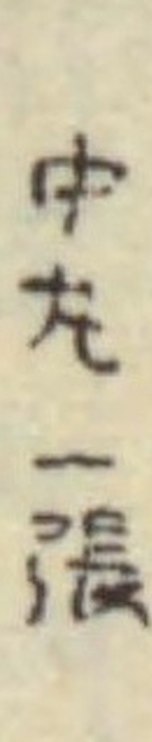中丸一張
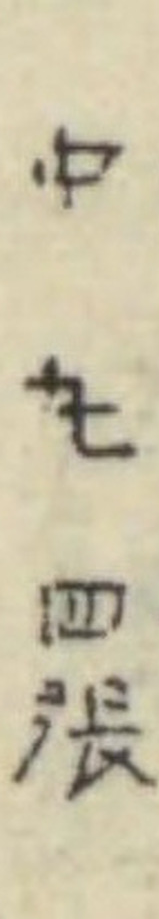中丸四張
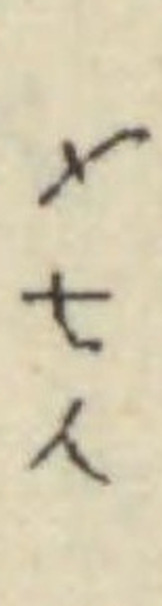〆七人
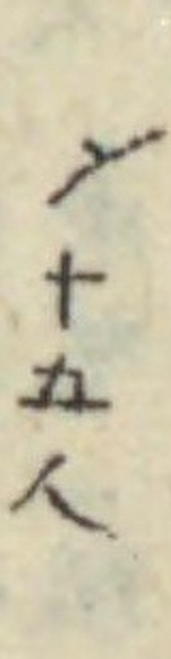〆十五人
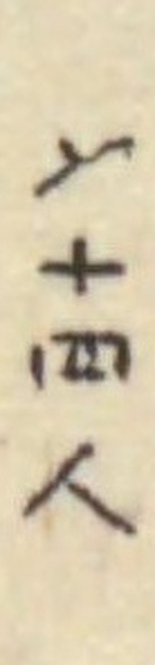〆十四人
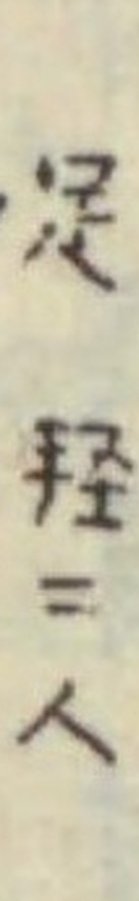足軽二人
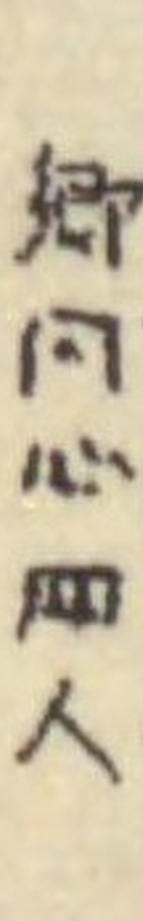御同心四人
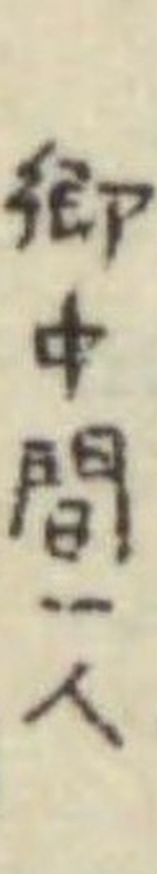厩中間一人
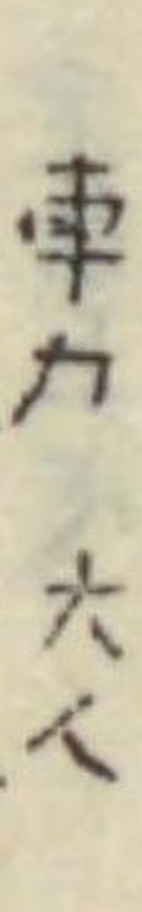車力六人
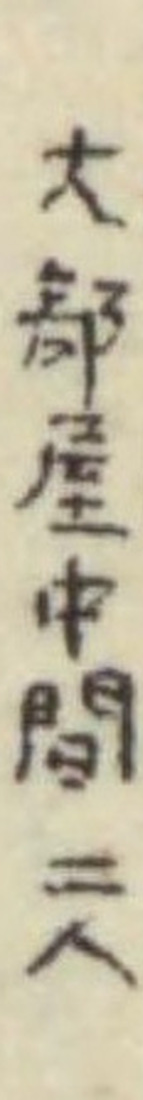大部屋中間二人
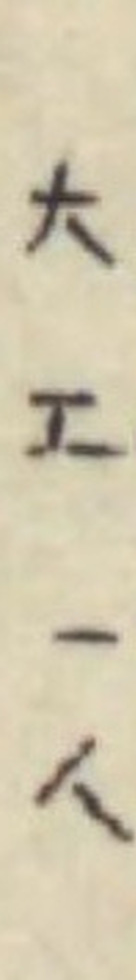大工一人
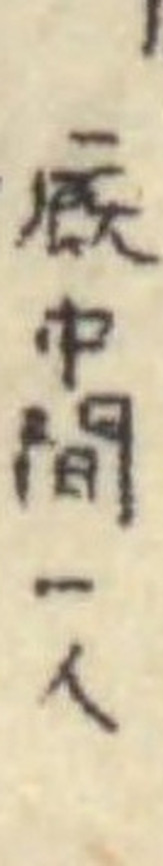厩中間一人
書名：三河吉田藩動員史料
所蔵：国立国会図書館 National Diet Library, JAPAN
